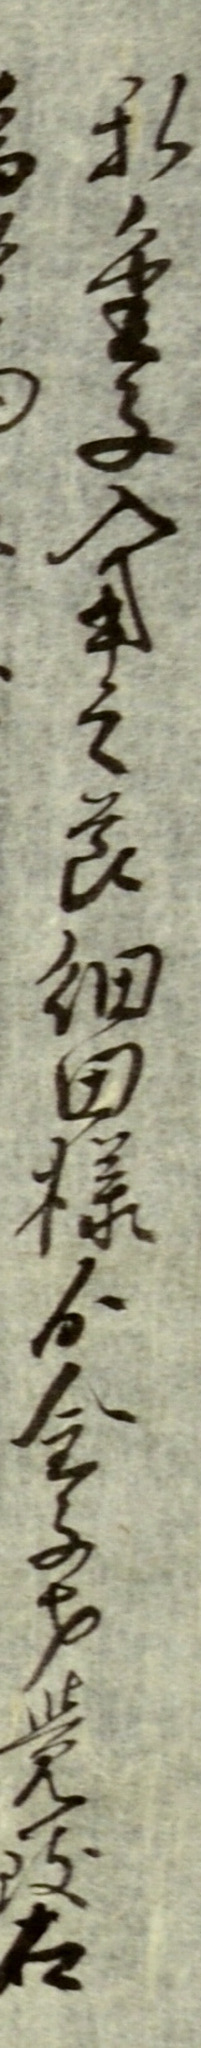一私金子入用之節細田様ゟ金子才覚致右
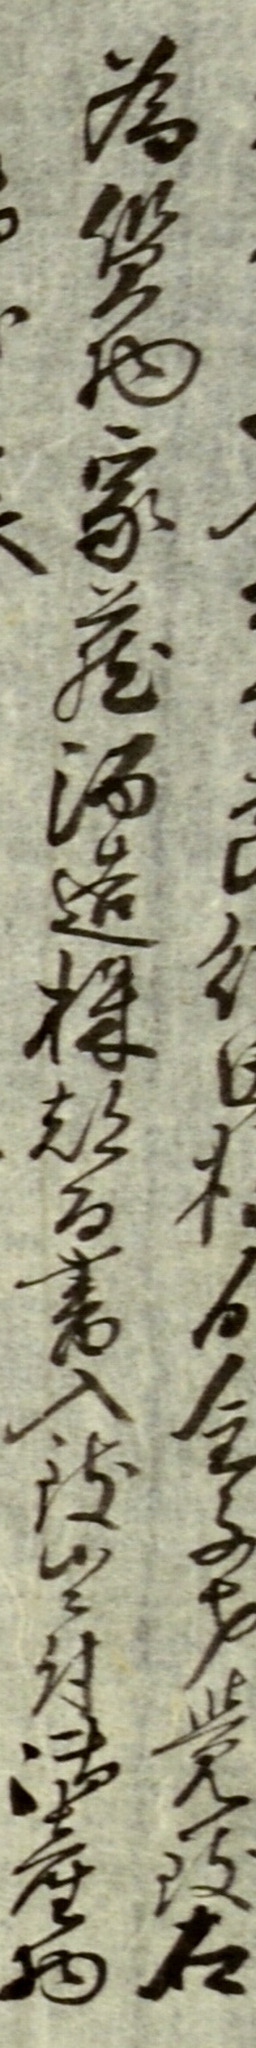為質物家蔵酒造株都而書入致候ニ付御産物
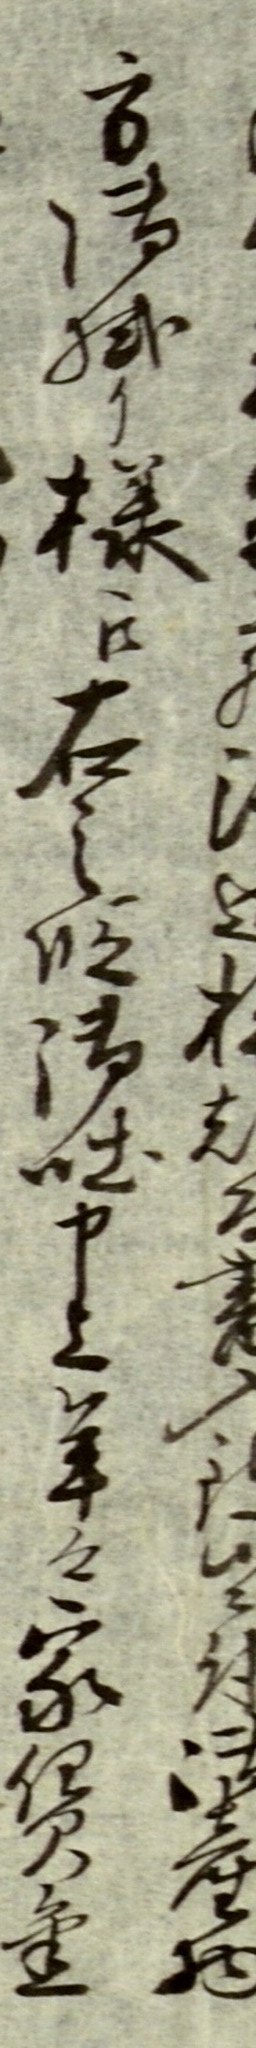方御掛り様江右之段御咄申上年々家貸金
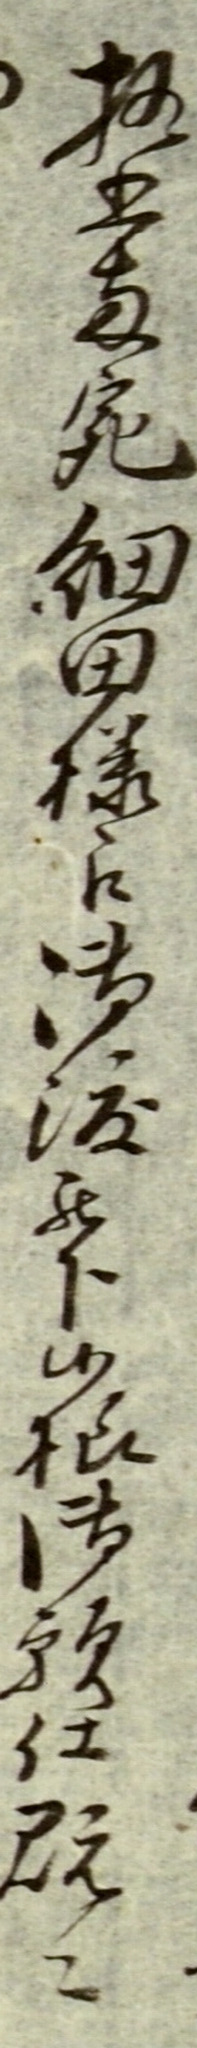拾五両宛細田様江御渡被下候様御願仕既ニ
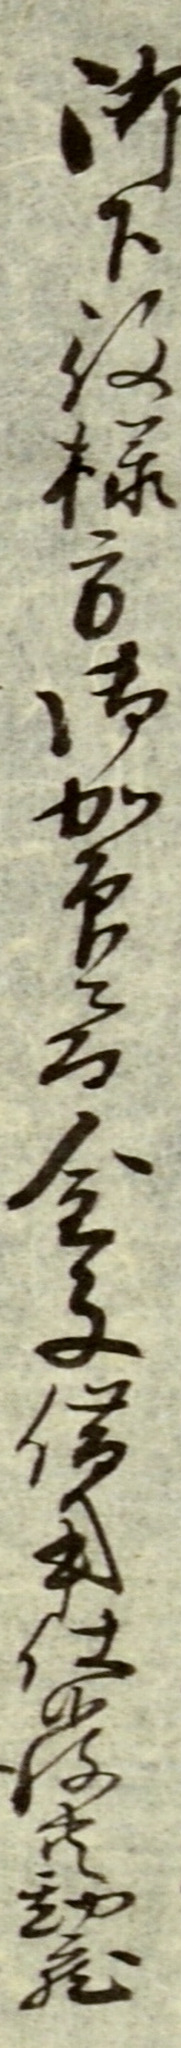御下役様方御加印ニ而金子借用仕候得共勘蔵
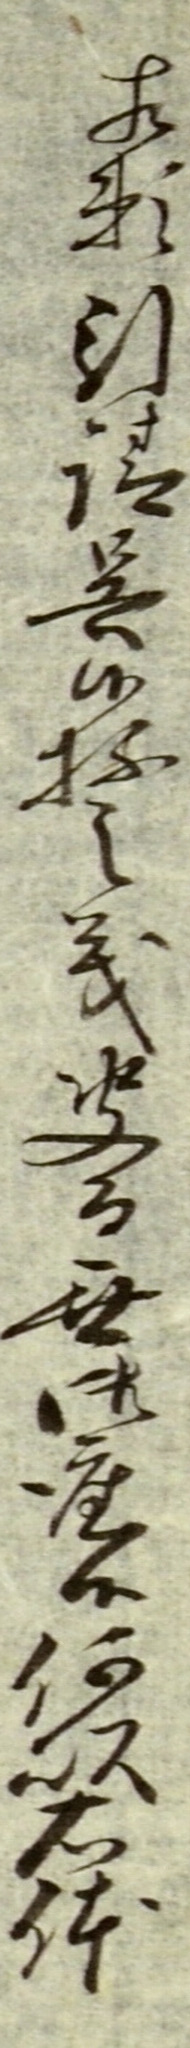相願引請呉候抔之義決而無御座候何以右体
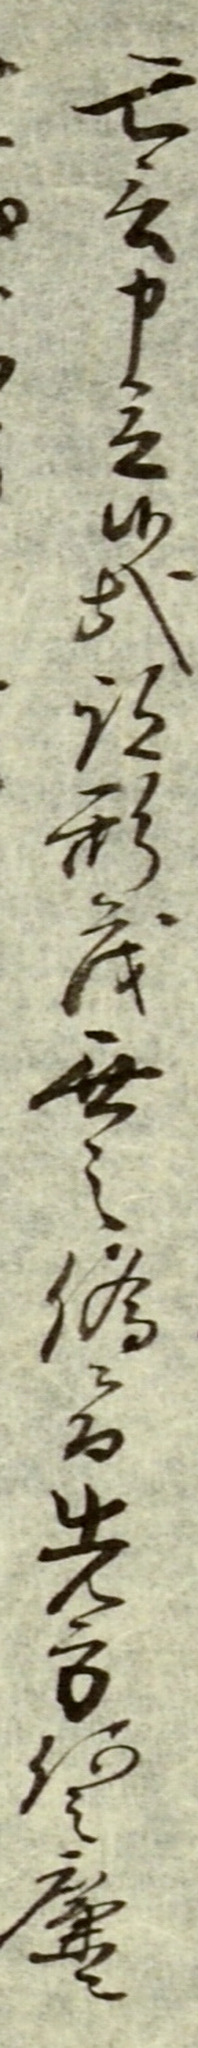亡言申立候哉跡形茂無之偽ニ而先方何之虚ニ
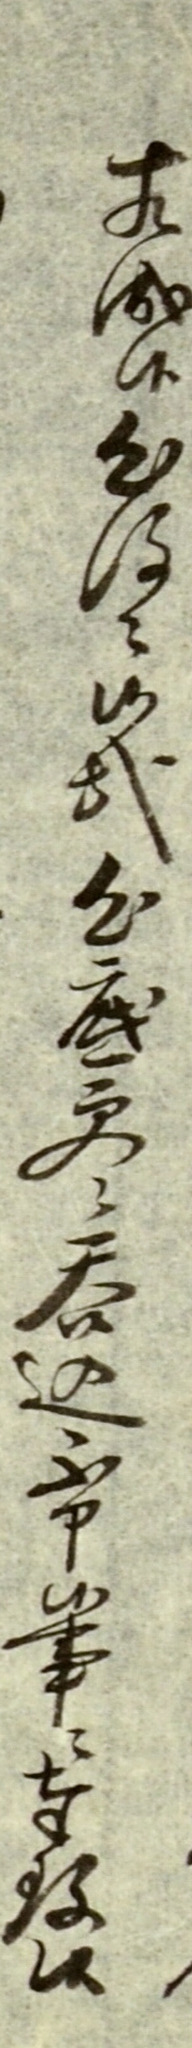相成候心得ニ候哉心底更ニ呑込不申候事ニ奉存候
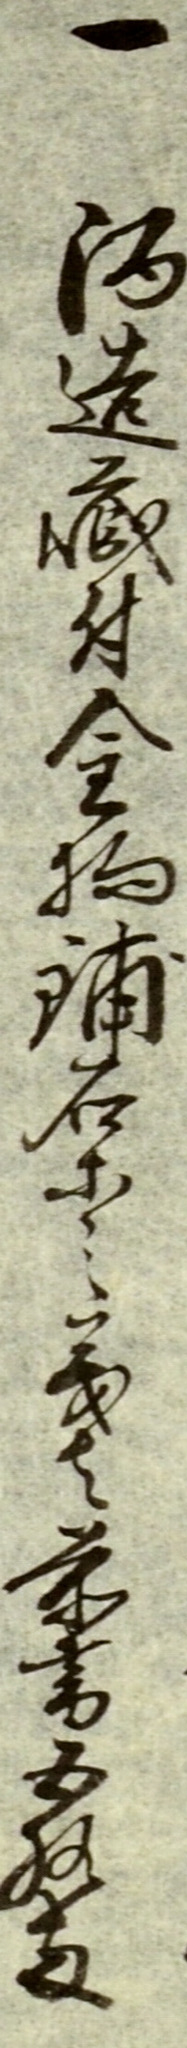一酒造蔵付金物鋪右等之義者前書五拾両
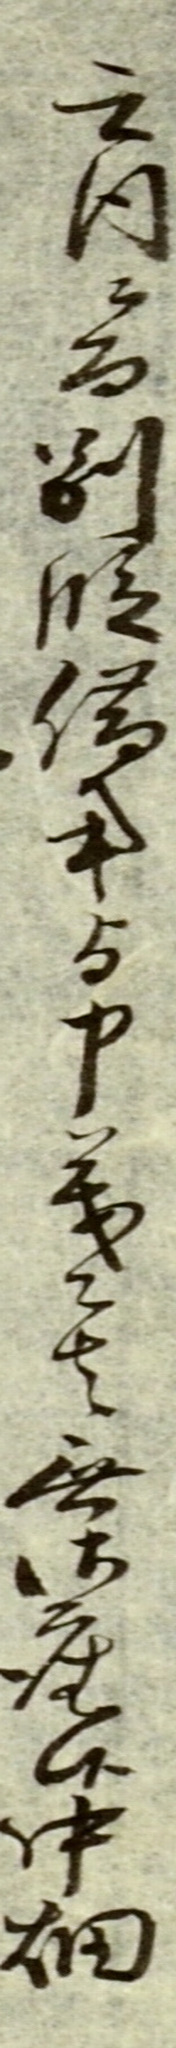之内ニ而別段借用と申義ニ者無御座候中畑
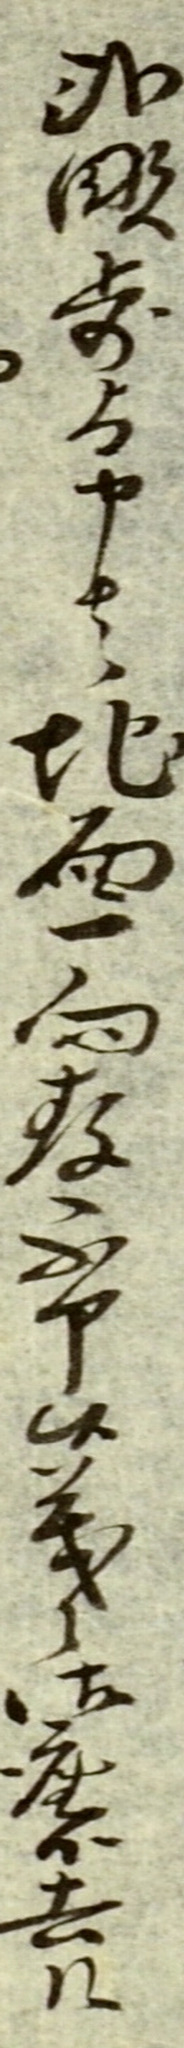弐畝歩と申者地面一向存不申候義ニ御座候去ル
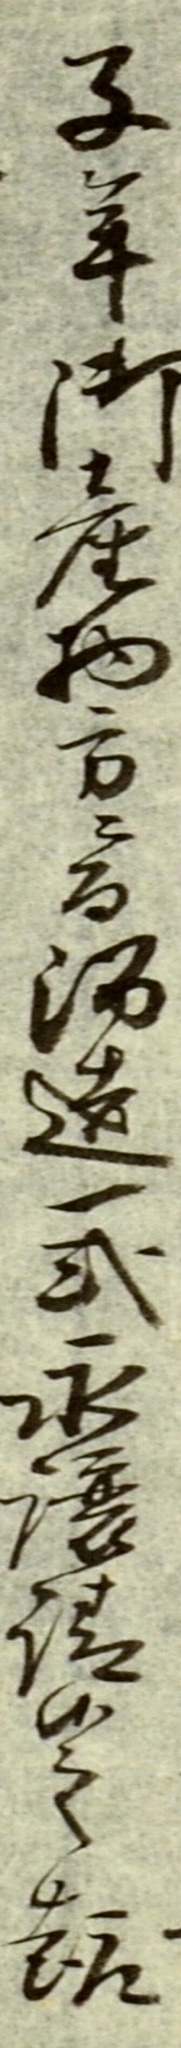子年御産物方ニ而酒造一式永譲請候之趣
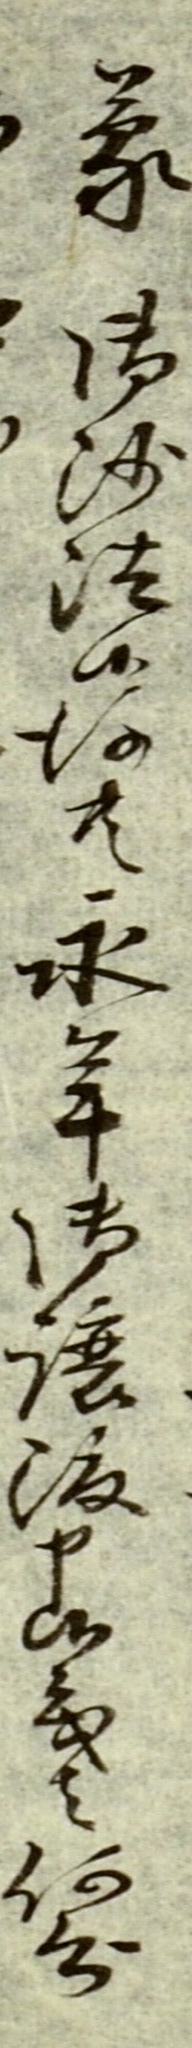蒙御沙汰候得共永年御譲渡申候義者何分
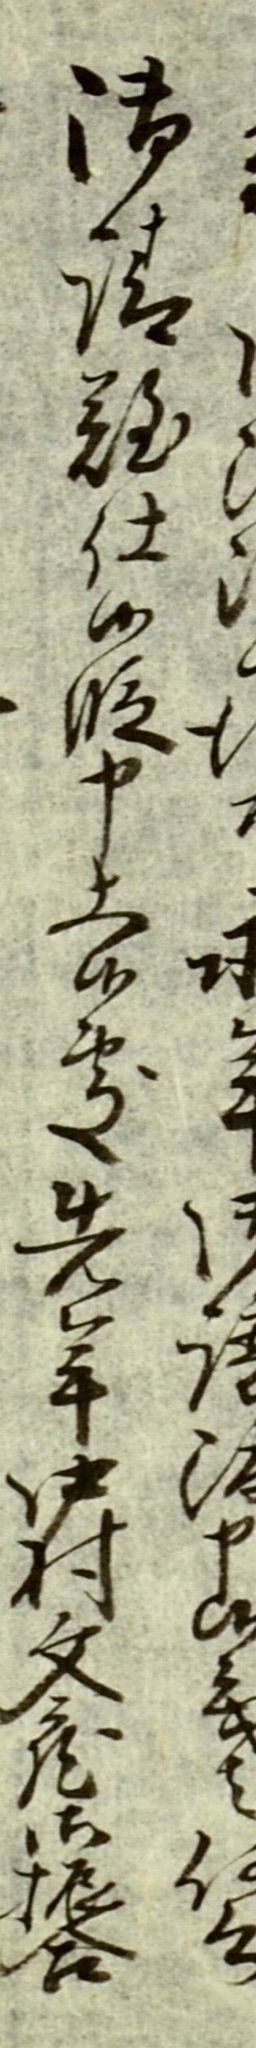御請難仕候段申上候処先年中村文蔵御振合
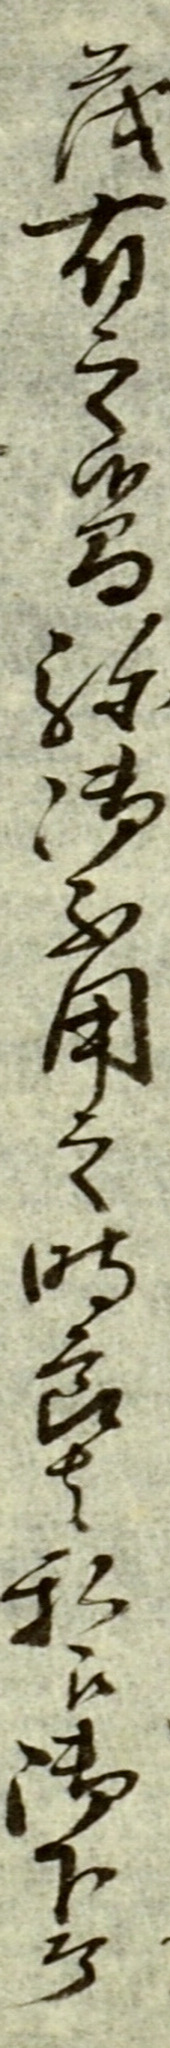茂有之候間弥御不用之時節者私江御下ケ
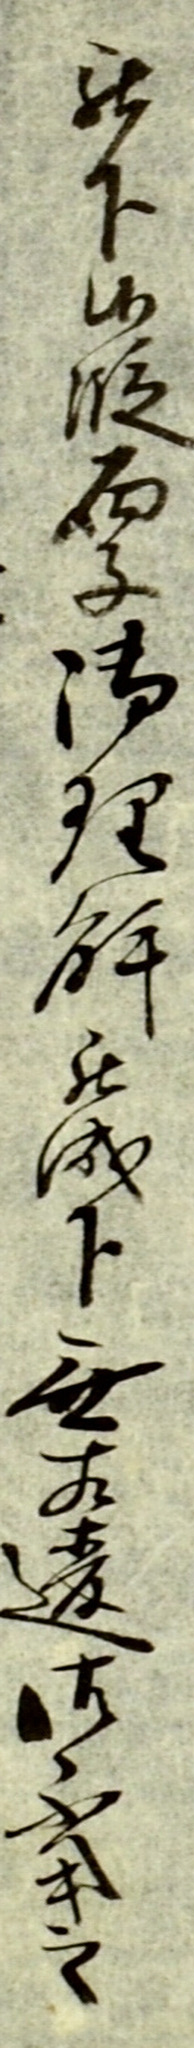被下候段厚御理解被成下無相違御不用之
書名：乍恐以口上書奉申上候御事
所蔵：伊那市立高遠町図書館・合同会社AMANE
